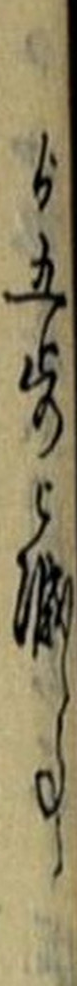ゟ五歩被減候事
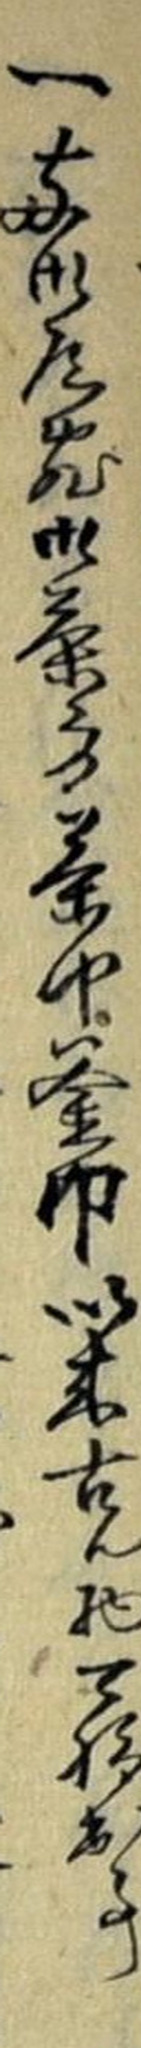一両御屋敷御茶方茶巾釜巾以来古ル物可指出事
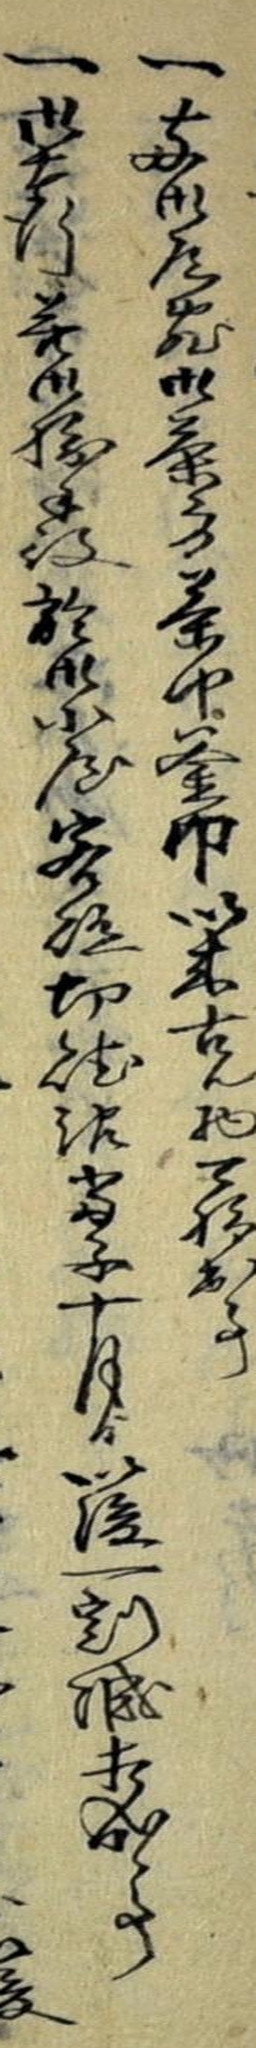一御奉行并御勝手役於御小屋客賄切賦銀当子十月ゟ以後一割減相成候事
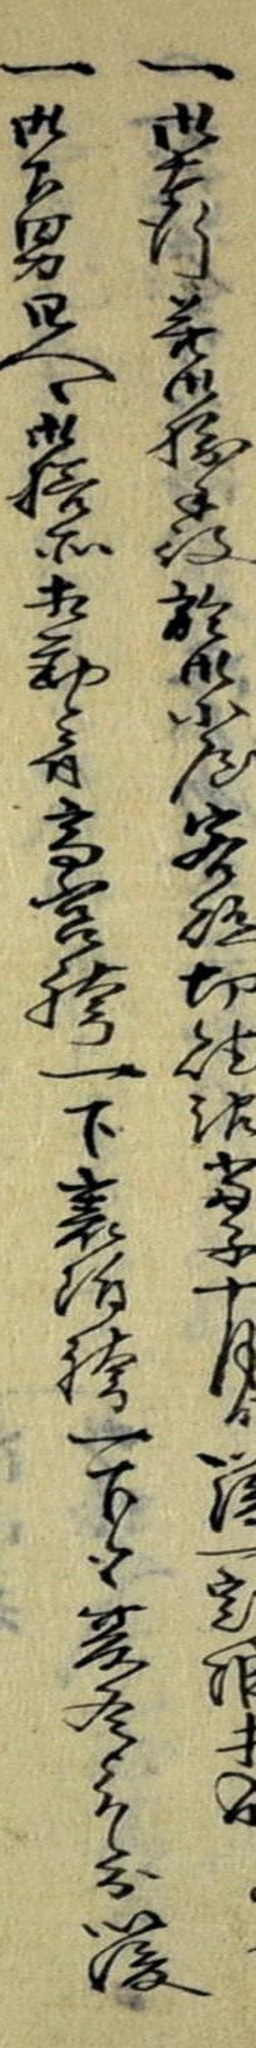一御下男四人御膳所相勤候に付高宮袴一下裏附袴一下つヽ夏冬被下候分以後
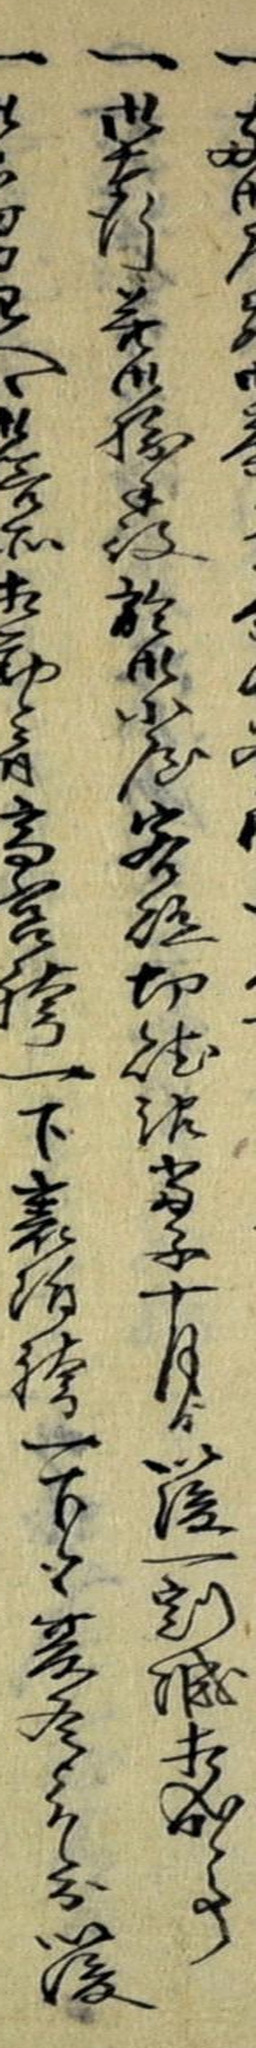一御下男四人御膳所相勤候に付高宮袴一下裏附袴一下つヽ夏冬被下候分以後
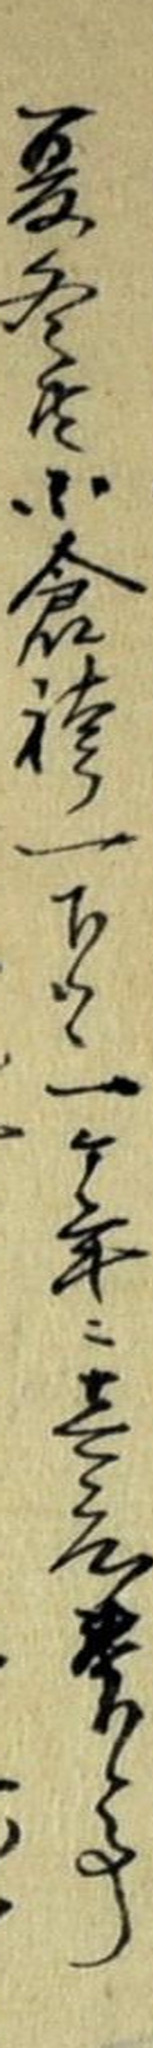夏冬共小倉袴一下つヽ一ヶ年に壱度被下候事
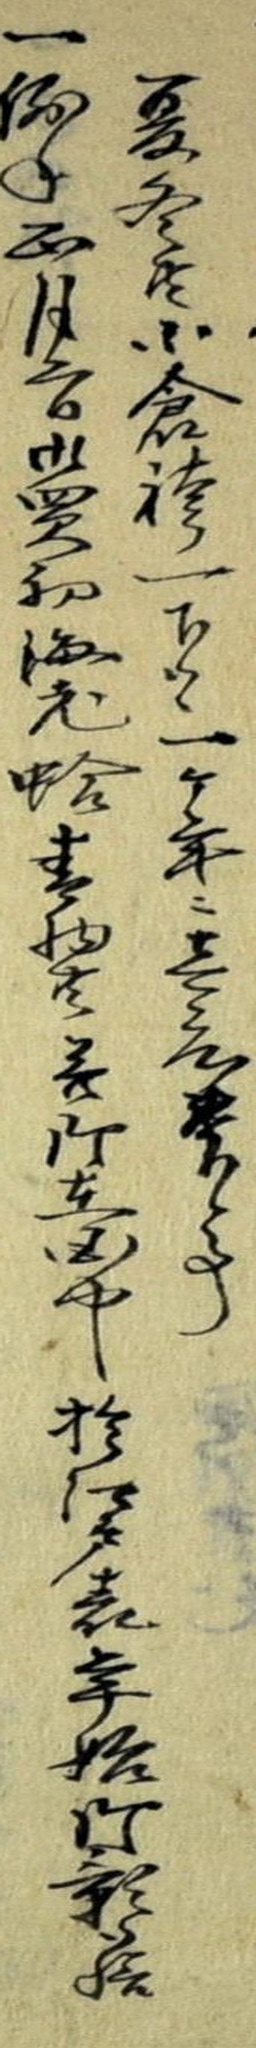一例年正月二日御買物海老蛤青物共并御在国中於江戸表年始御歓御膳
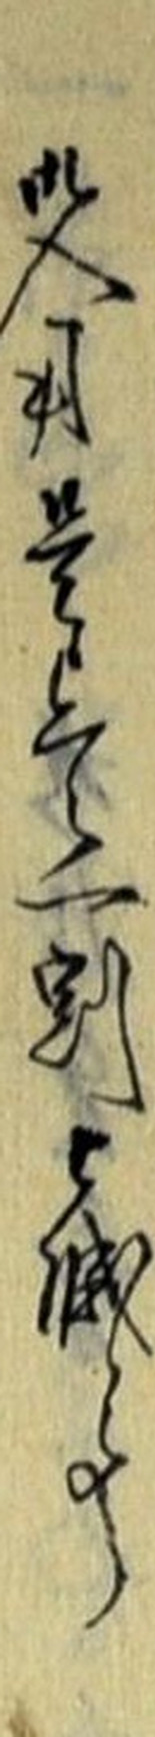御入用是迄之一割被減候事
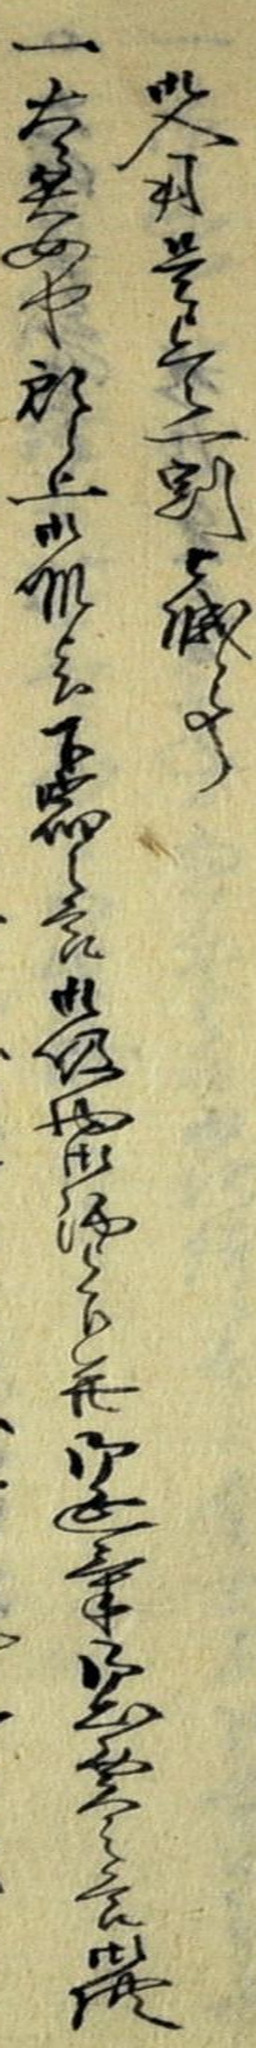一大奥女中願之上御暇被下下宿之節御吸物御酒被下并御延気御出殿之節御供
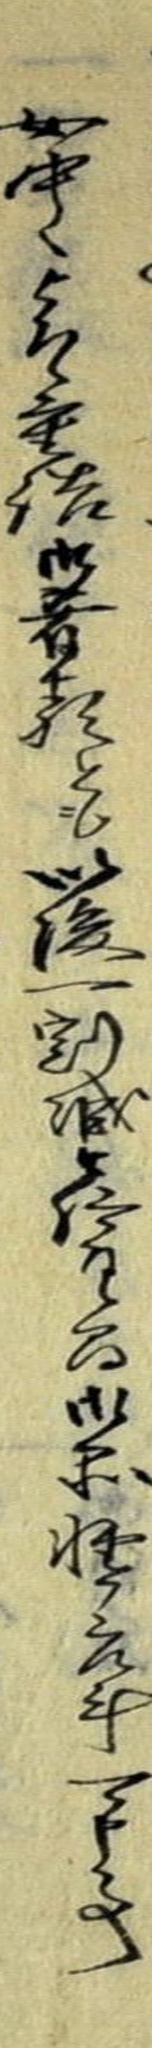女中へ被下候重詰御肴類とも以後一割減被仰付候間御品軽く取斗可申事
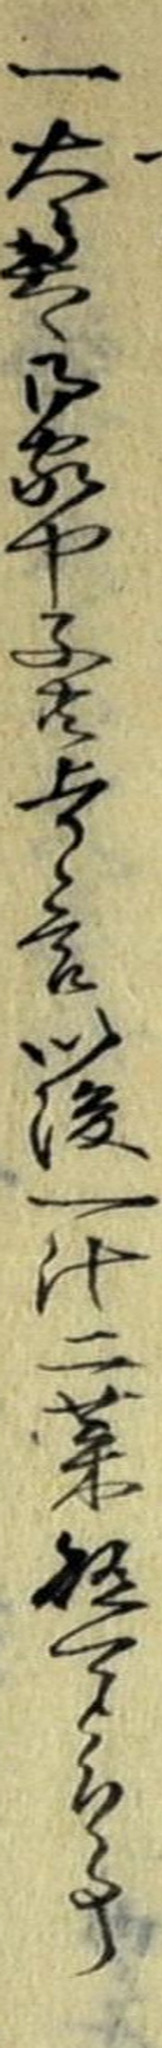一大奥へ御家中子供上り候節以後一汁二菜賄可被下候事
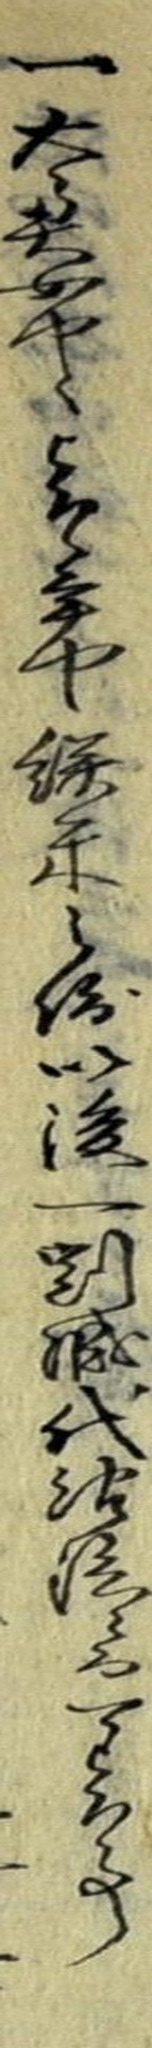一大奥女中へ被下候年中餅米之儀以後一割減代銀給に而可被下候事
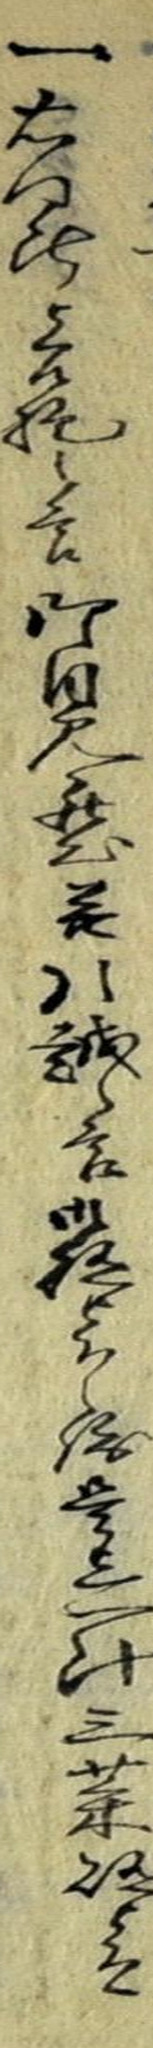一右同断被召抱候節御目見罷出并引越候節御賄被下候儀是迄一汁三菜賄被下候
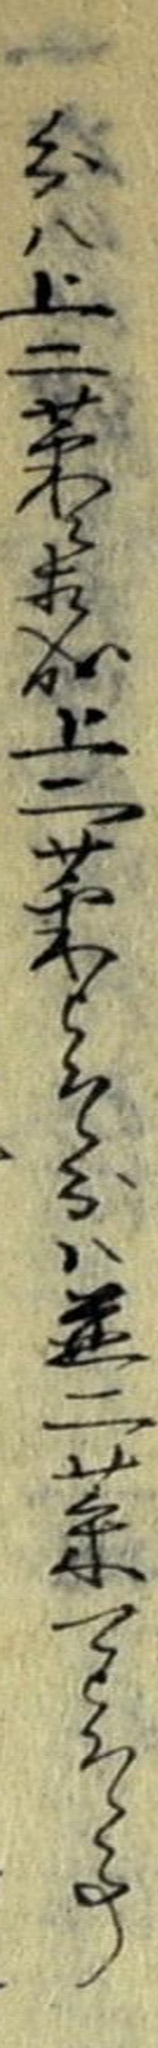分は上二菜に相成上二菜被下候分は並二菜可被下候事
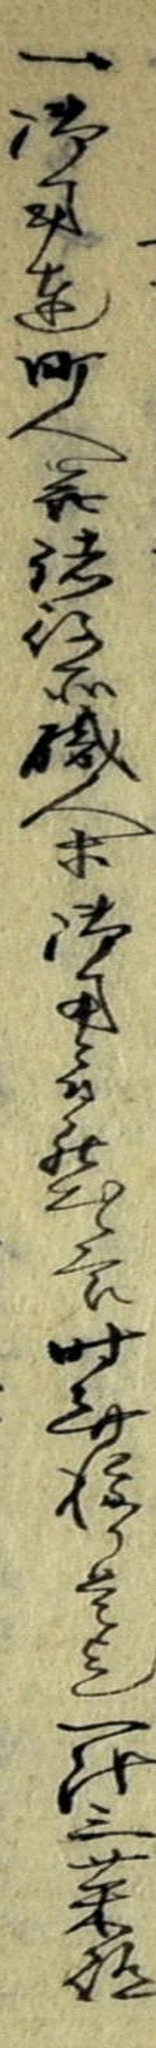一御用達町人并諸役所職人等御用に付罷出候節時刻移り是迄一汁三菜賄
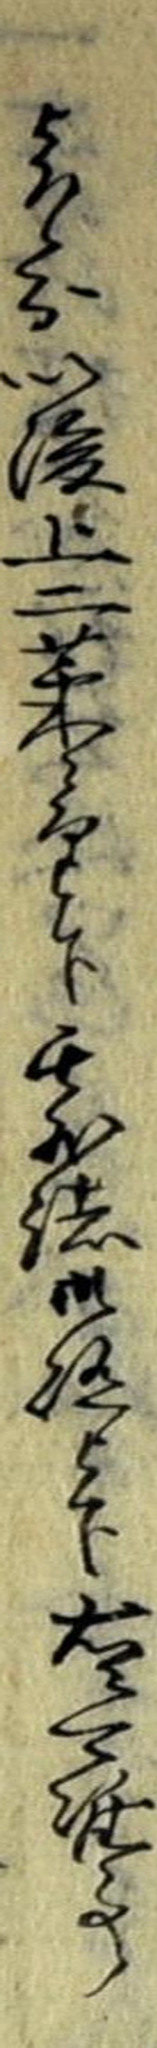被下候分以後上二菜に而被下其外諸御賄被下右に可准事
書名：命令之部 四
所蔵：福井県文書館 Fukui Prefectural Archives
